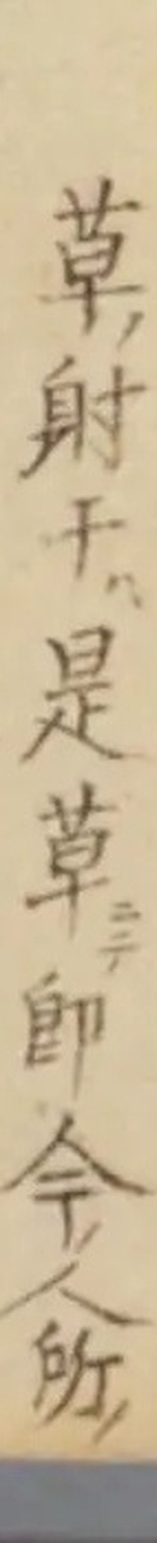草ノ射干ハ是草ニテ即今ノ人所ノ

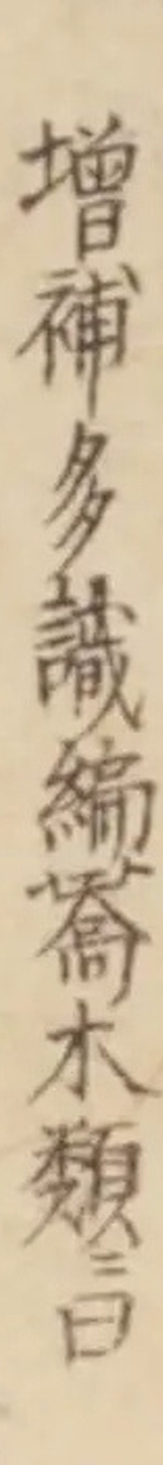増補多識編喬木類ニ曰
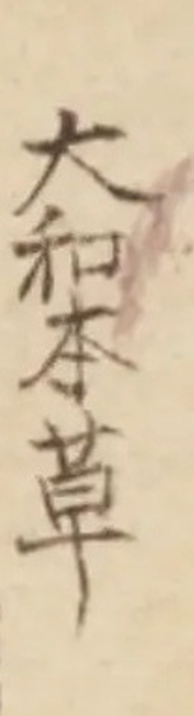大和本草
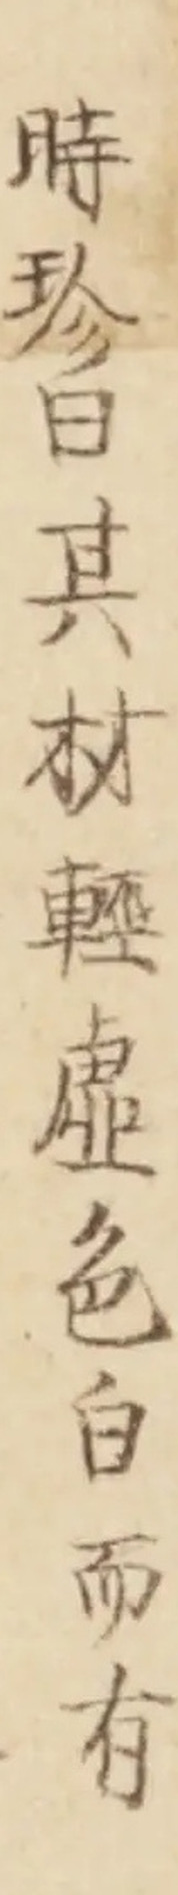時珍日其材軽虚色白而有
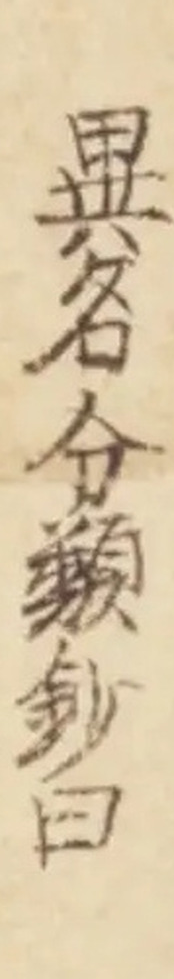異名分類曰
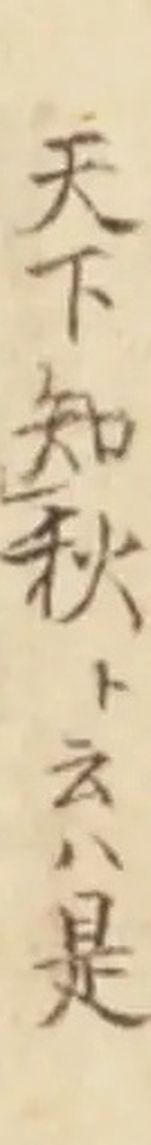天下知秋ト云ハ是
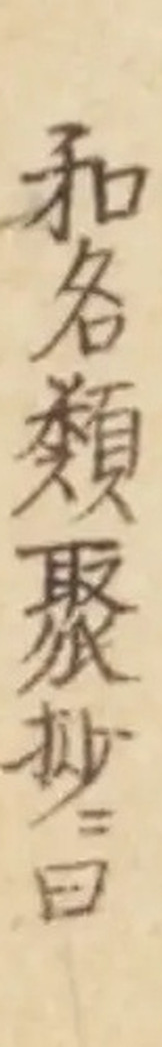和名類聚抄ニ曰
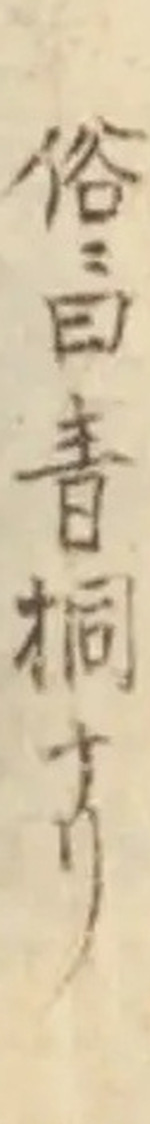俗ニ青桐ナリ
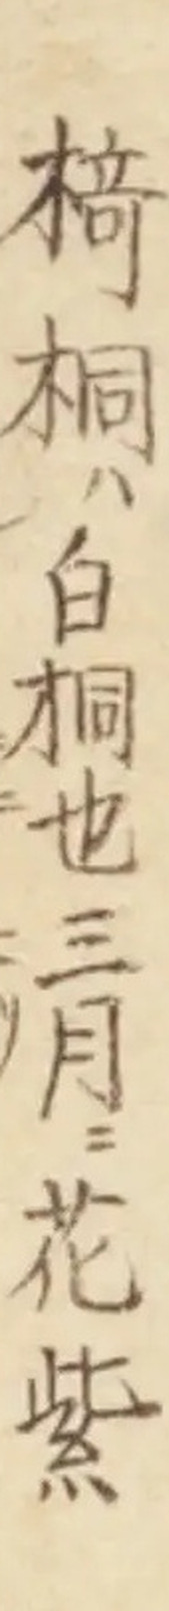桐ハ白桐也三月ニ花紫
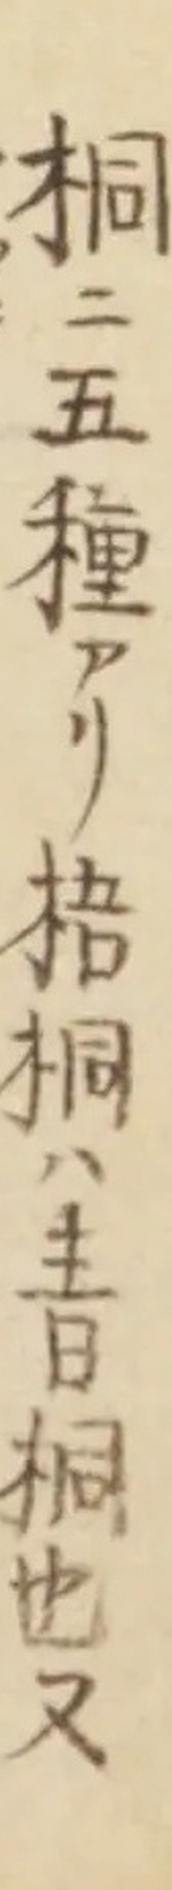桐ニ五種アリ梧桐ハ青桐也又
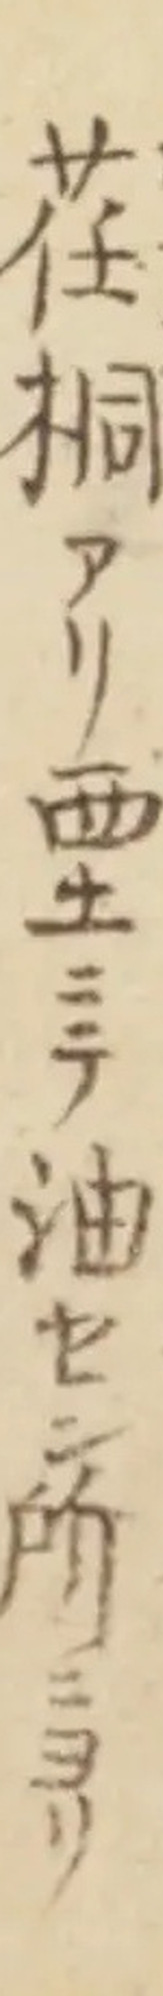荏桐アリシテ油セン所ニヨリ
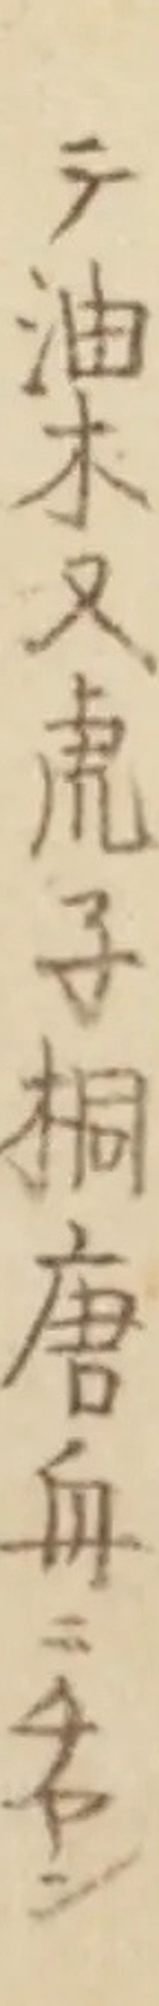テ油木又虎子桐唐舟ニチヤン
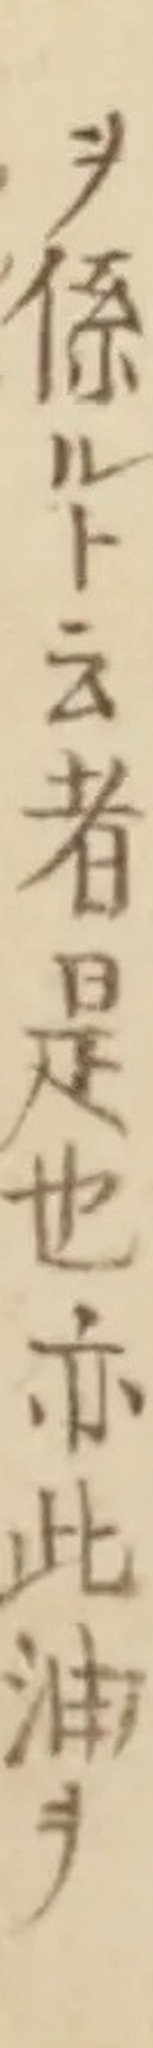ヲ係ルト云者是也又此油ヲ
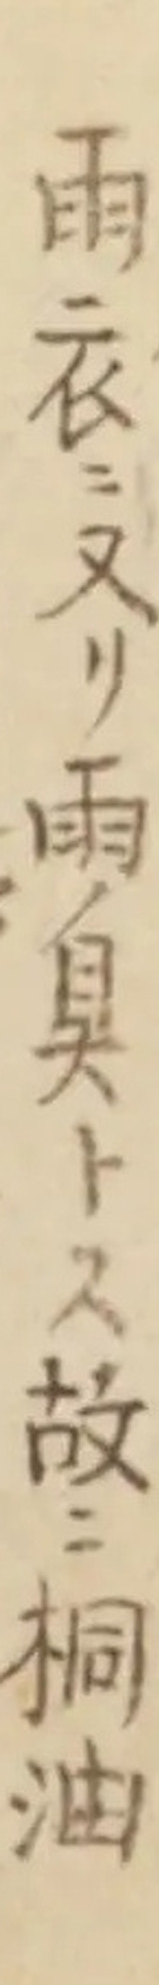雨衣ニ又リ雨の臭トス故ニ桐油
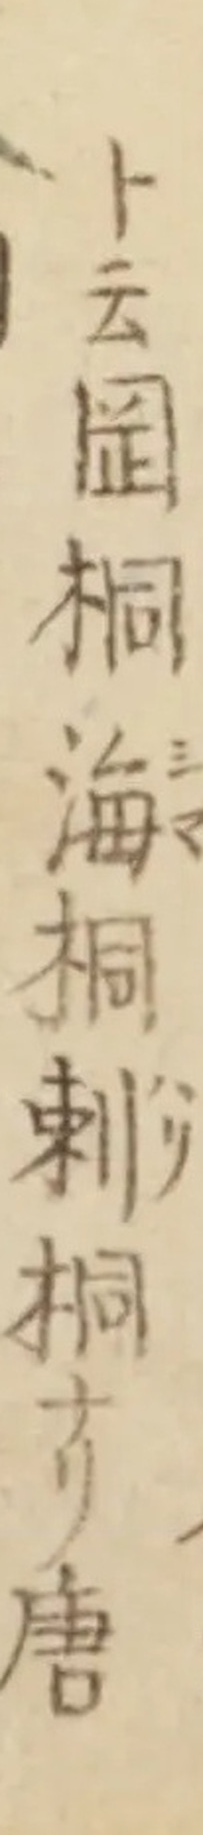ト云桐海桐刺桐ナリ唐
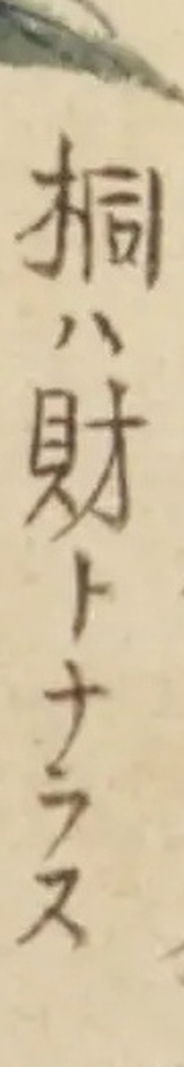桐ハ財トナラス
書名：梅園草木花譜夏之部. 1
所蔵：国立国会図書館 National Diet Library, JAPAN
